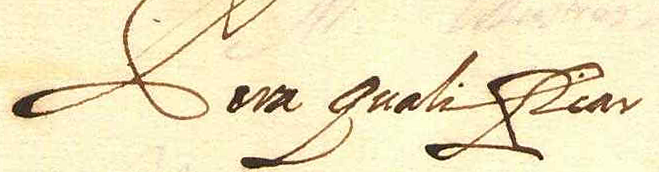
Para qualificar
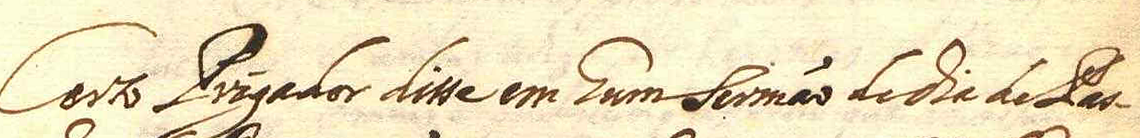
Certo Pregador disse em hum Sermaõ de dia de Pas
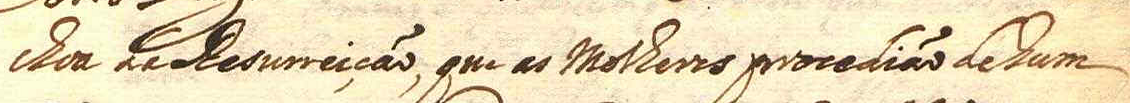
choa da Resurreição, que as molheres procediaõ de hum
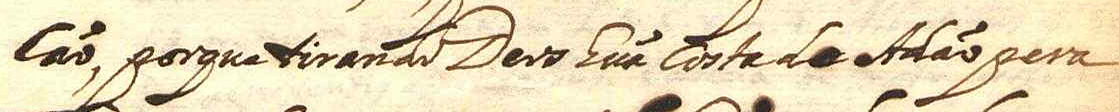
caõ, porque tirando Deos huā costa de Adaõ pera
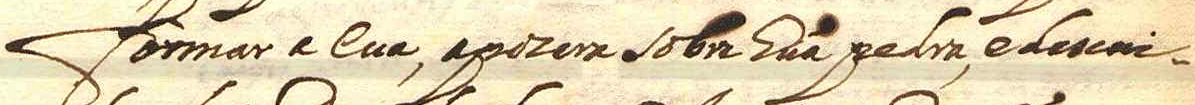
formar a Eua, a pozera sobre huā pedra, e descui
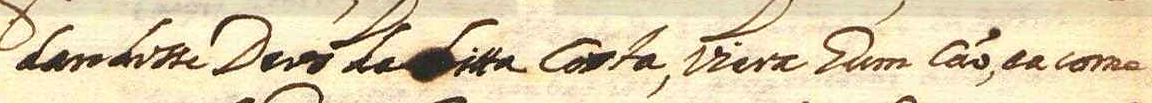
dandosse Deos da ditta Costa, viera hum caõ, e a come
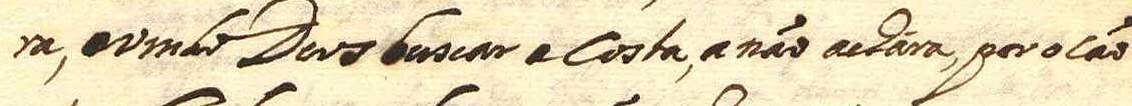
ra, e vindo Deos buscar a Costa, a não achára, por o caõ
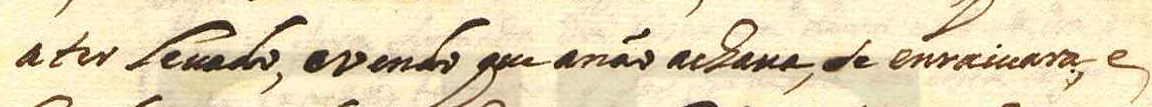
a ter leuado, e vendo que a naõ achaua, se enraiuara, e
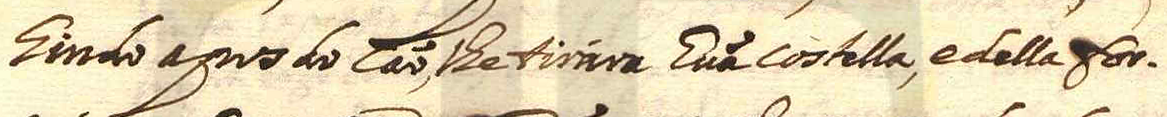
hindo a pes do caõ, lhe tirára huā costella, e della for
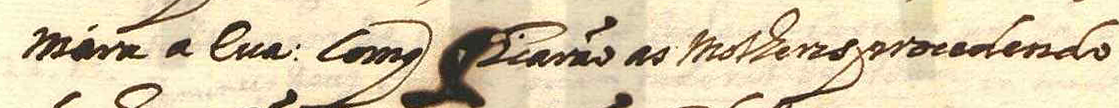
mára a Eua: com q̄ ficaraõ as molheres procedendo
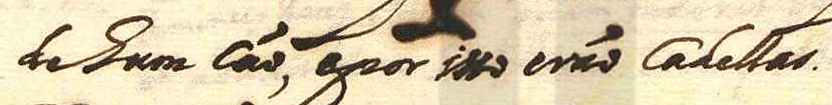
de hum cão, e por isso erão cadellas.
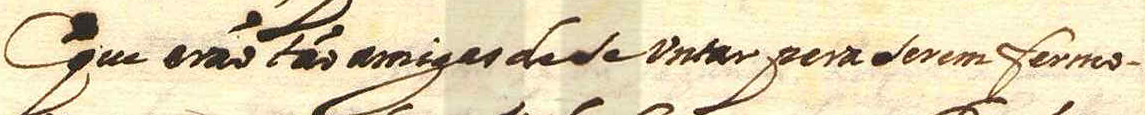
E que eraõ tão amigas de se vntar pera serem fermo
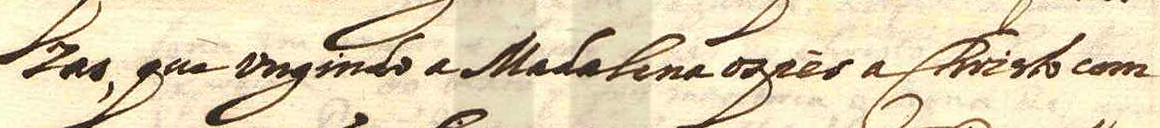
zas, que vngindo a Madalena os pès a Christo com
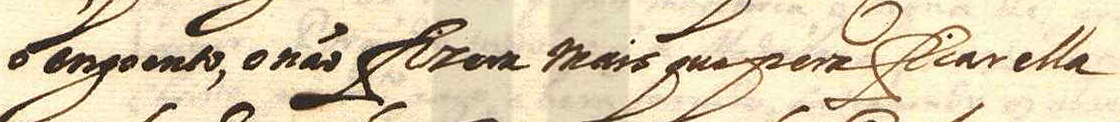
o engoento, o naõ fizera mais que pera ficar ella
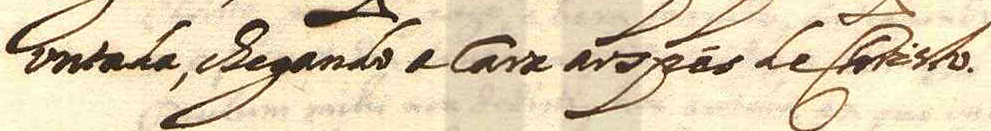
vntada, chegando a Cara aos pés de Christo.
